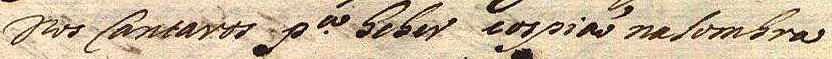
nos Cantaros p.a beber cospiaõ na sombra
